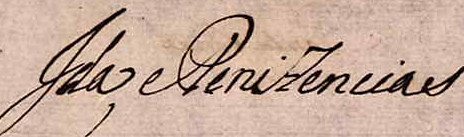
Jda, e Penitencias
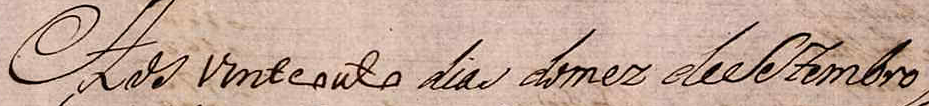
Aos vinte outo dias do mez de Setembro
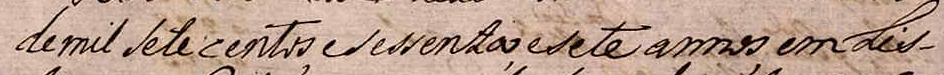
de mil setecentos e sessenta e sete annos em Lis
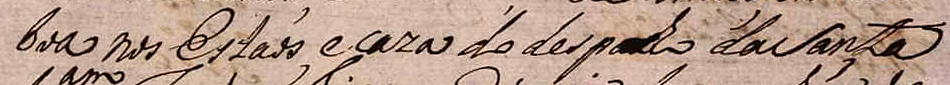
boa nos Estaos, e caza do despacho da Santa
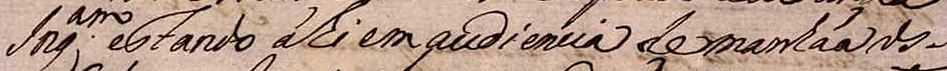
Inq.am estando ahi em audiencia de manhaã os
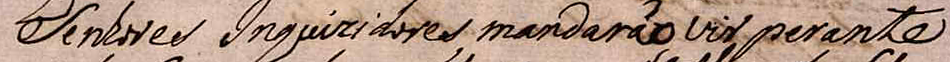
Senhores Inquizidores, mandarão vir perante
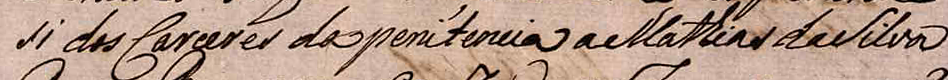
si dos Carceres da penitencia á Mathias da Silva
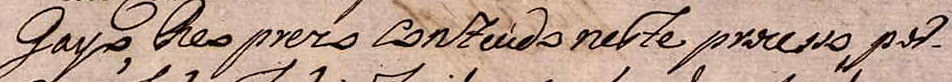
Gayo, Reo prezo conteùdo neste processo, por
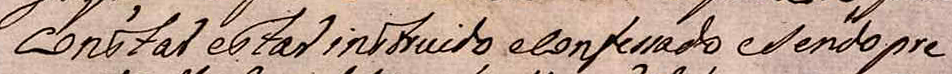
constar estar instruido, e confessado, e sendo pre
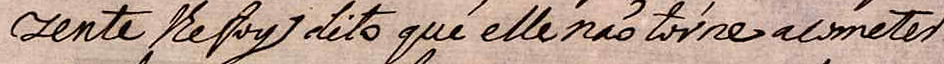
zente lhe foy dito que elle naõ torne a cometer
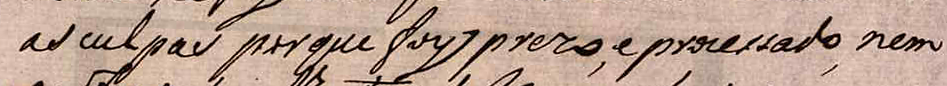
as culpas porque foy prezo, e processado, nem
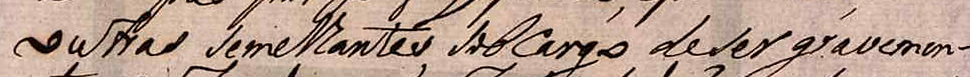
outras semelhantes, sob cargo de ser gravemen
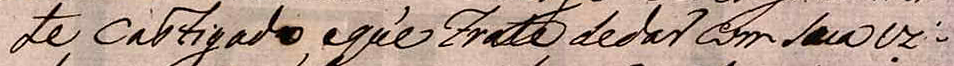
te castigado, e que trate de dar com sua vi
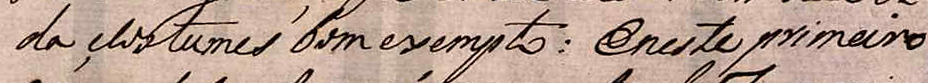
da, e costumes bom exempto: E neste primeiro
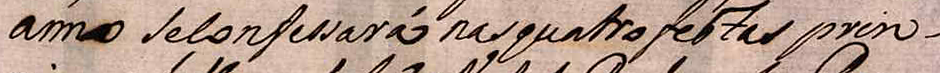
anno se confessará nas quatro festas prin
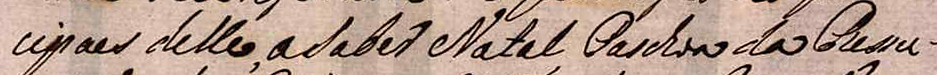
cipaes delle, a Saber Natal, Paschoa da Ressu
